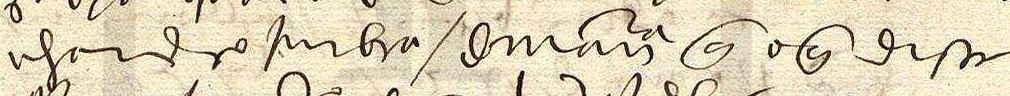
nhar ē coJmbra / de manra q̄ o q̄ disse
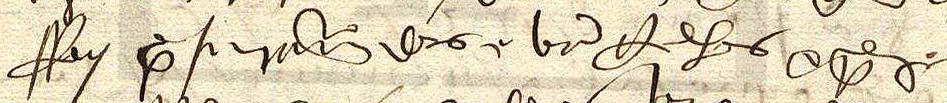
ffoy p̄o Juramto dos evāgelhos e p̄o ser
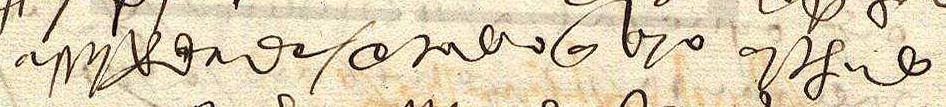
assy ꝟdade / e todo o q̄ vjo ꝯtheudo
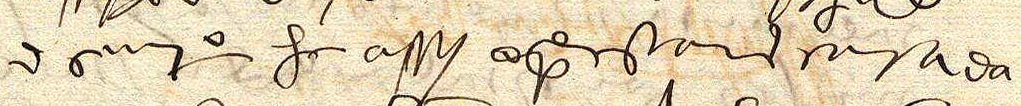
ē seu to he assy e p̄o estar ē casa da
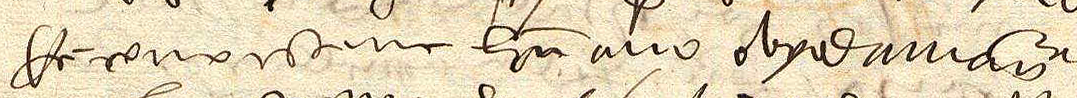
Ree como esteue hū ano o vyo da manra
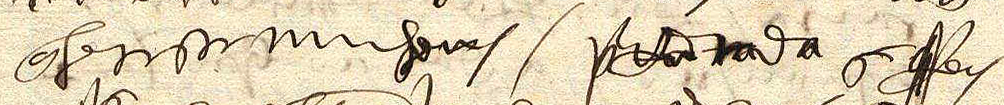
q̄ ho testemunhou // p̄gūtada se ffoy
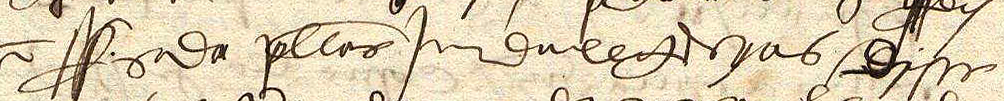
cōffesada pl̄las Jndullgēcyas / djsse
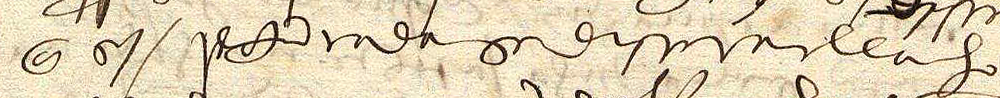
q̄ sy / p̄gūtada se dissera ella ho
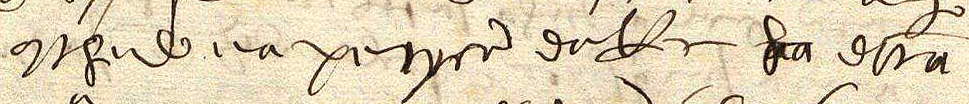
ꝯtheudo na petyçā da Ree ha dita
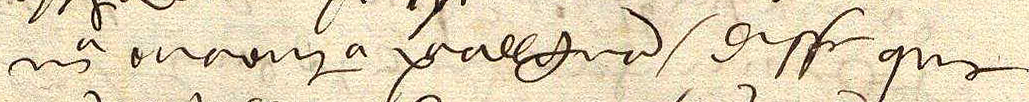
ma ou a outa pa alguā / disse que
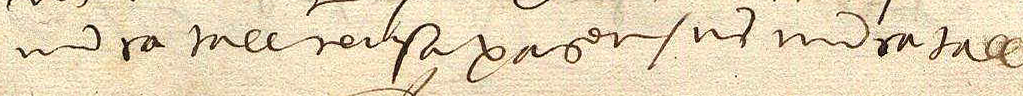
nūca tall cousa pasou / nē nūca tall
